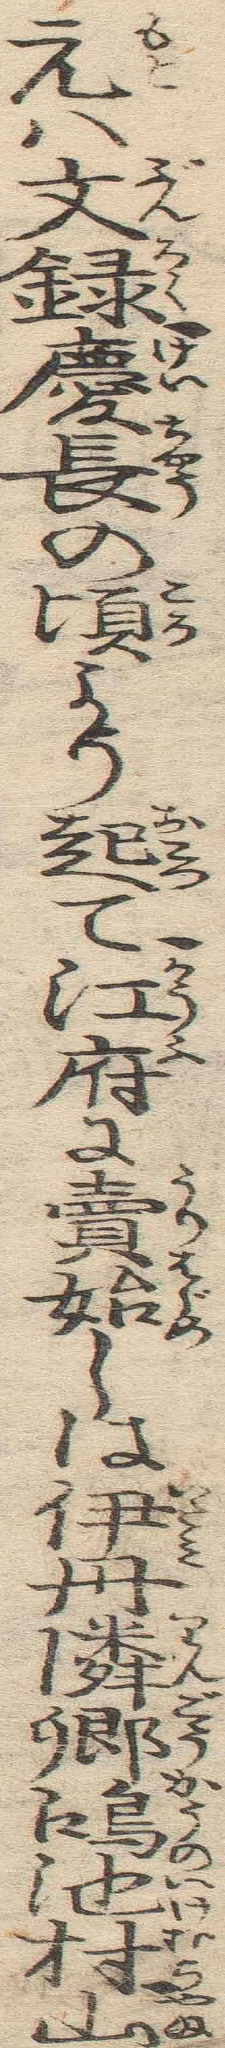元は文録。慶長の頃より起て。江府に売始しは伊丹隣郷鴻池村。山
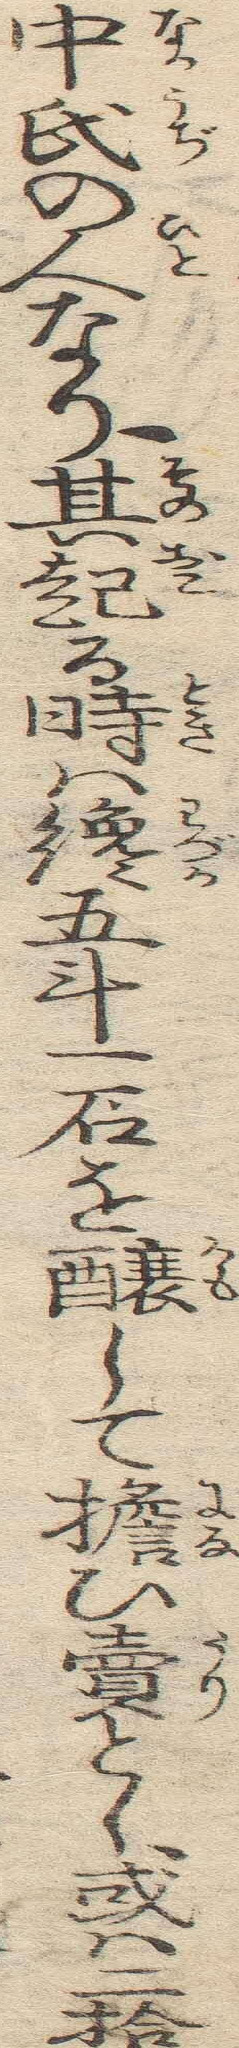中氏の人なり。其起る時は纔五斗一石を醸して担ひ売とし。或は二拾
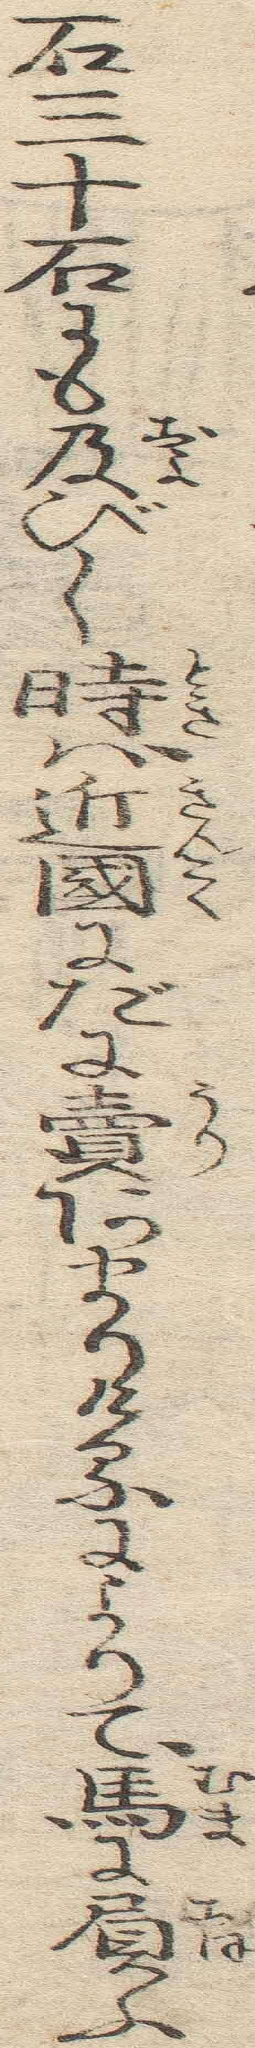石三十石にも及びし時は。近国にだに売あまりけるによりて。馬に屓ふ
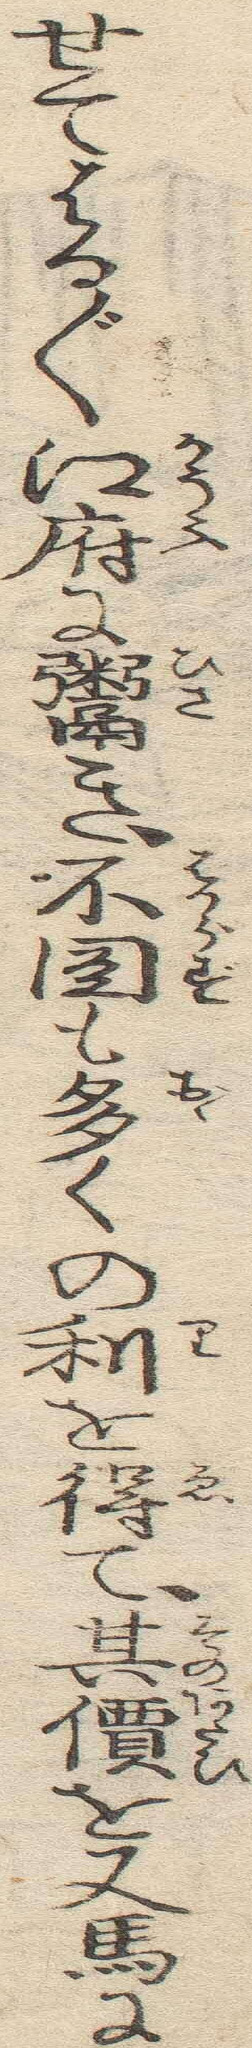せてはる〴〵江府に鬻き。不図も多くの利を得て。其価を又馬に
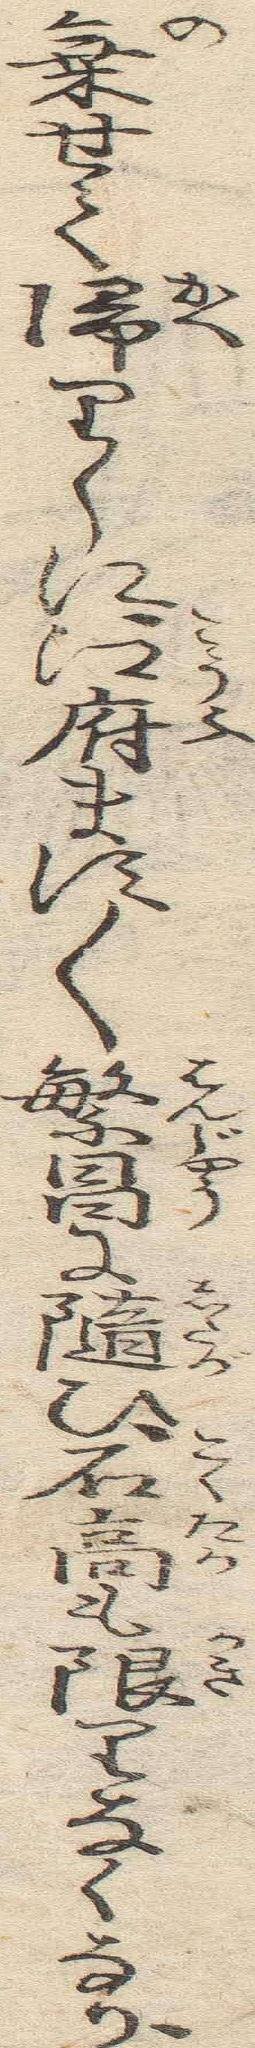乗せて帰りしに。江府ます〳〵繁昌に随ひ。石高も限りなくなり。
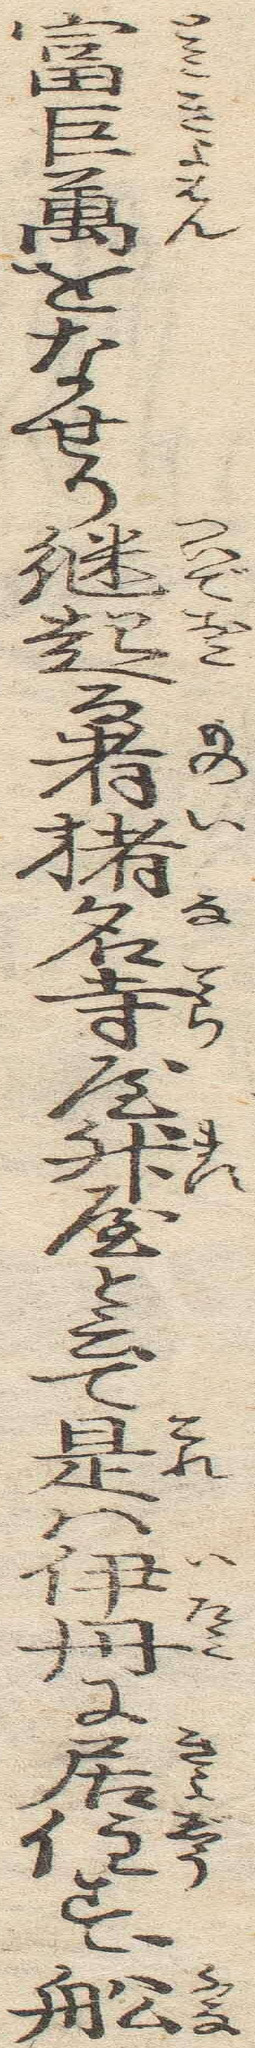富巨万をなせり継起る者猪名寺屋。舛屋と云て是は伊丹に居住す。船
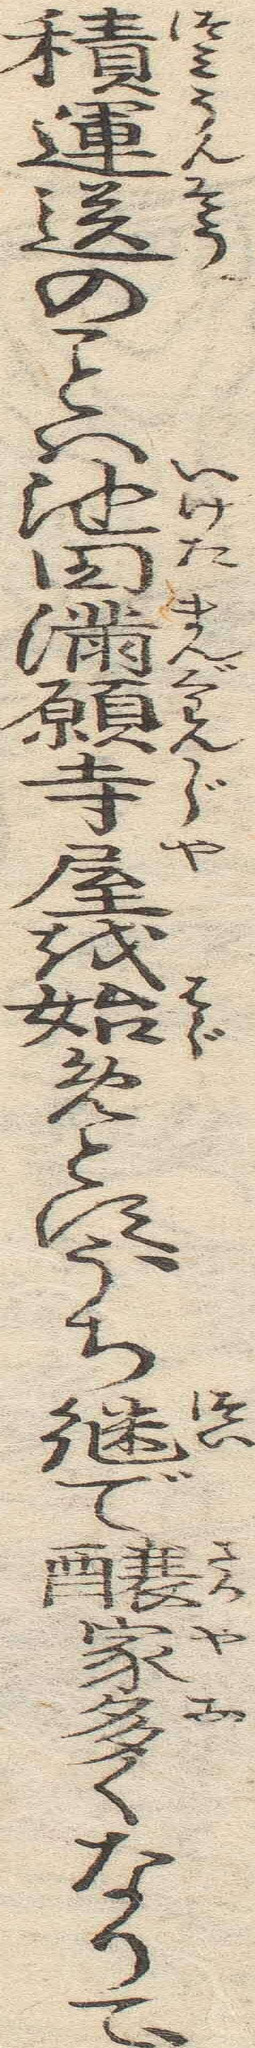積運送のことは池田満願寺屋を始めとす。うち継で醸家多くなりて。
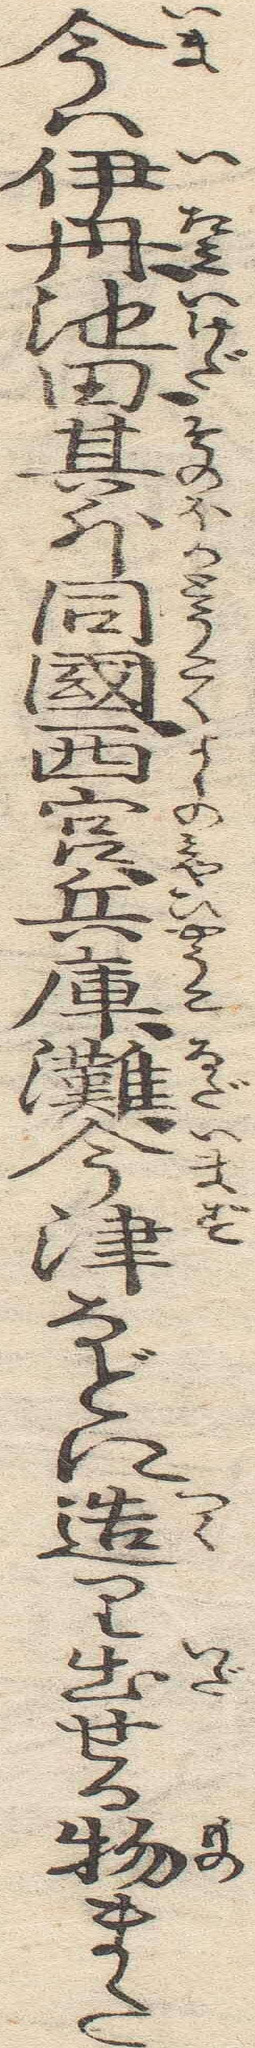今は伊丹。池田。其外同国。西宮。兵庫。灘。今津などに造り出せる物また
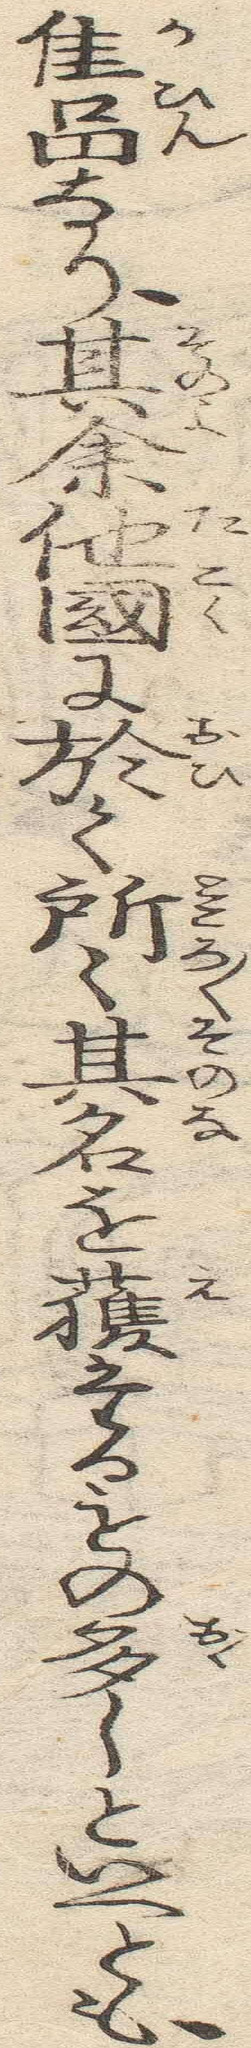佳品なり。其余他国に於て所〳〵其名を獲たるもの多しといへとも。
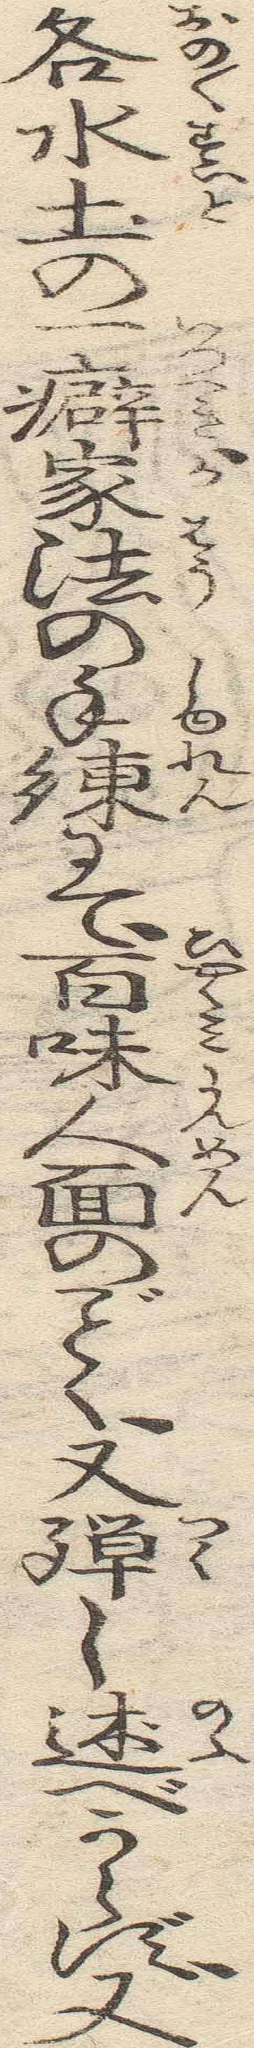各水土の一癖。家法の手練にて。百味人面のごとく。又殫し述べからず。又
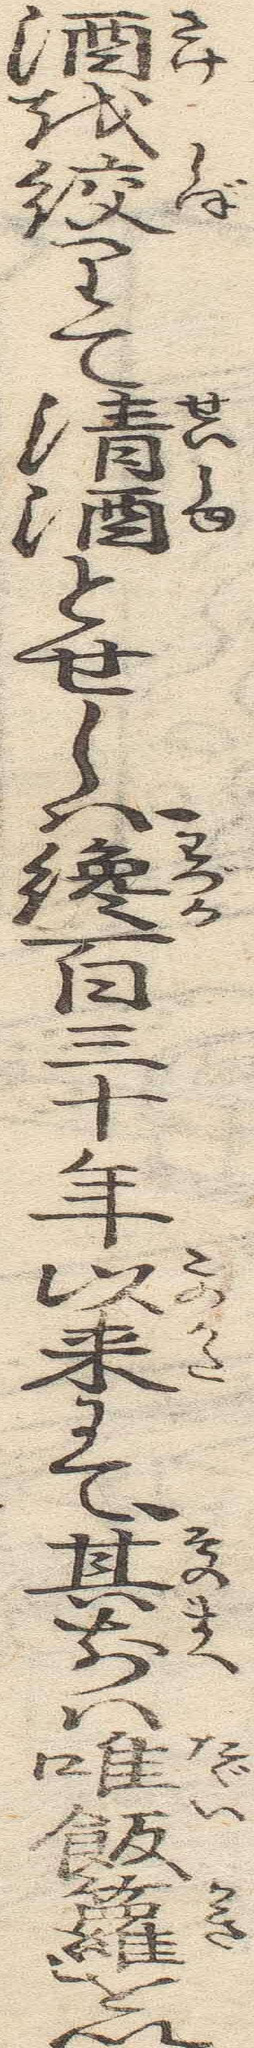酒を絞りて清酒とせしは。纔百三十年以来にて。其前は唯飯籮を以
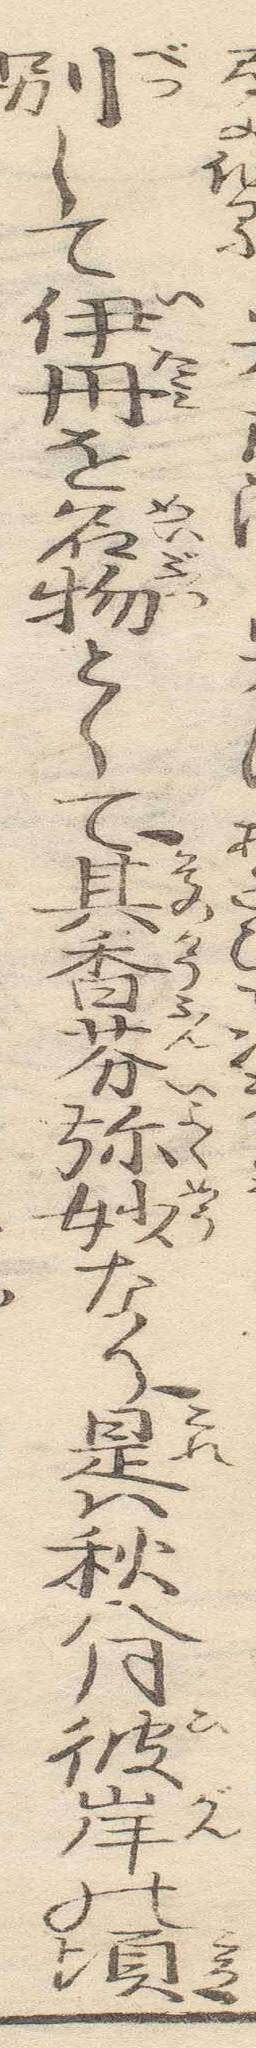別して伊丹を名物として。其香芬弥妙なり。是は秋八月彼岸の頃。
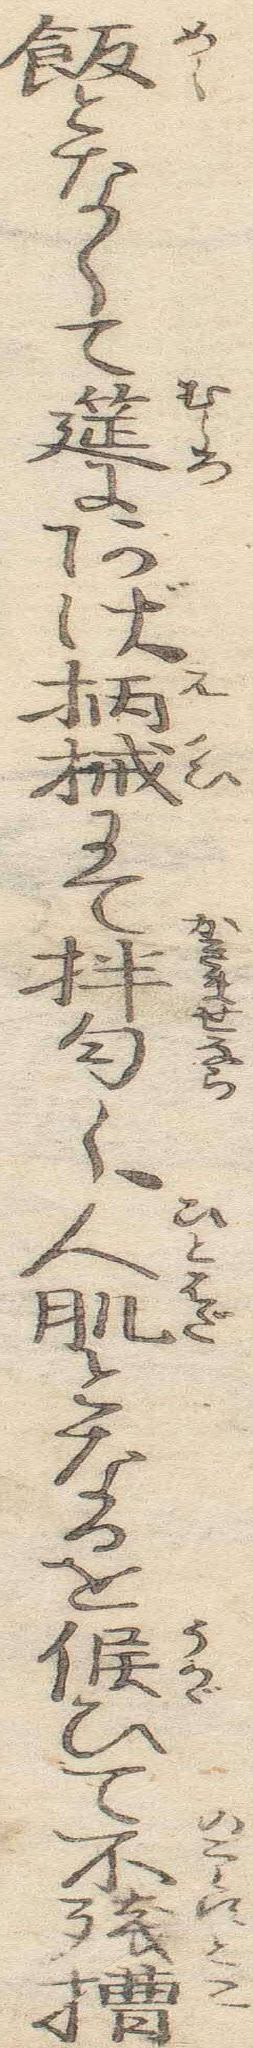飯となして筵にあげ。柄械にて拌匀し。人肌となるを候ひて不残槽
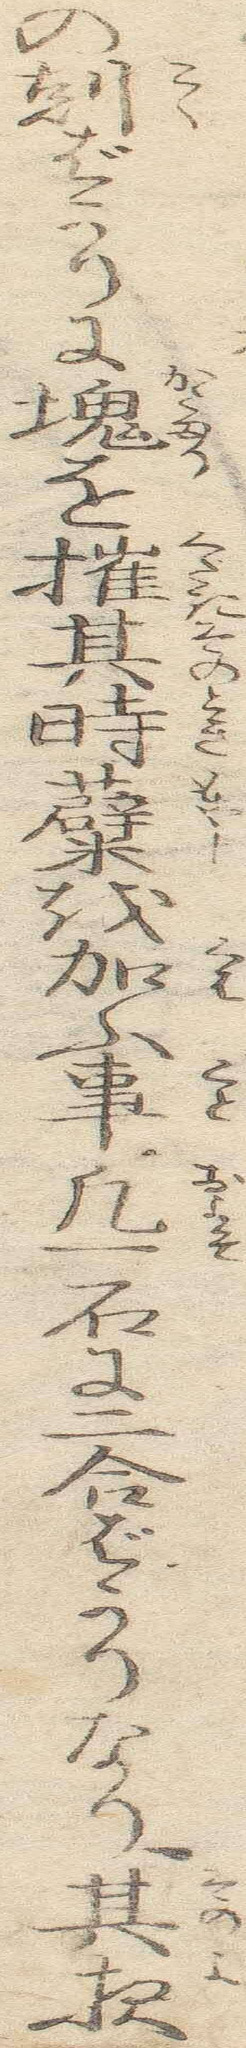の刻ばかりに塊を摧其時糵を加ふ事凡一石に二合ばかりなり。其夜
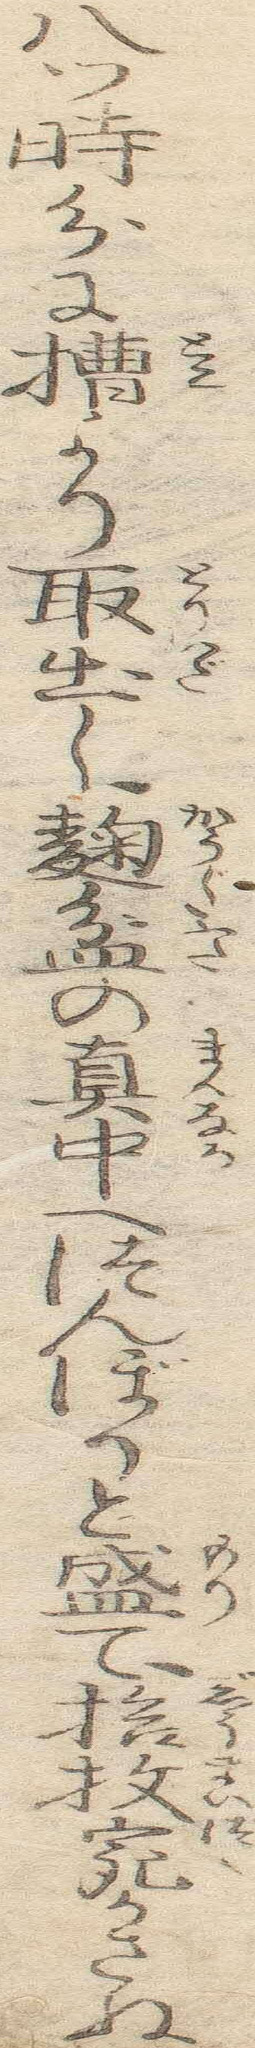八ツ時分に槽より取出し。麹盆の真中へつんぼりと盛て。拾枚宛かさね
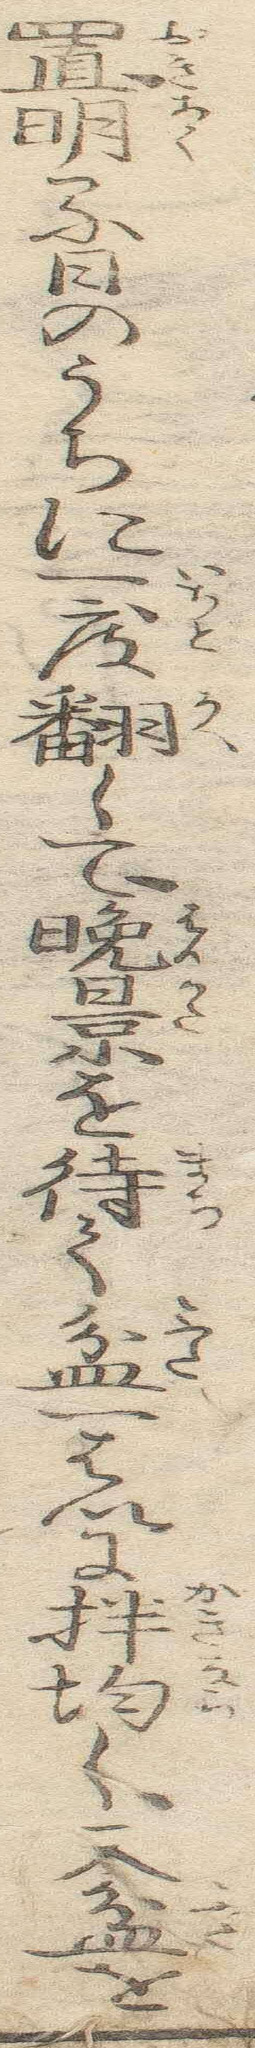置。明る日のうちに一度翻して。晩景を待て盆一はいに拌均し。又盆を
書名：日本山海名産図会
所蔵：東京学芸大学附属図書館 国文学研究資料館
